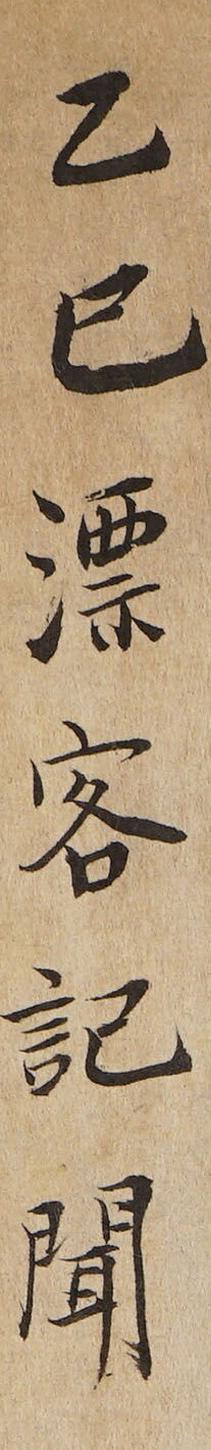乙巳漂客記聞
